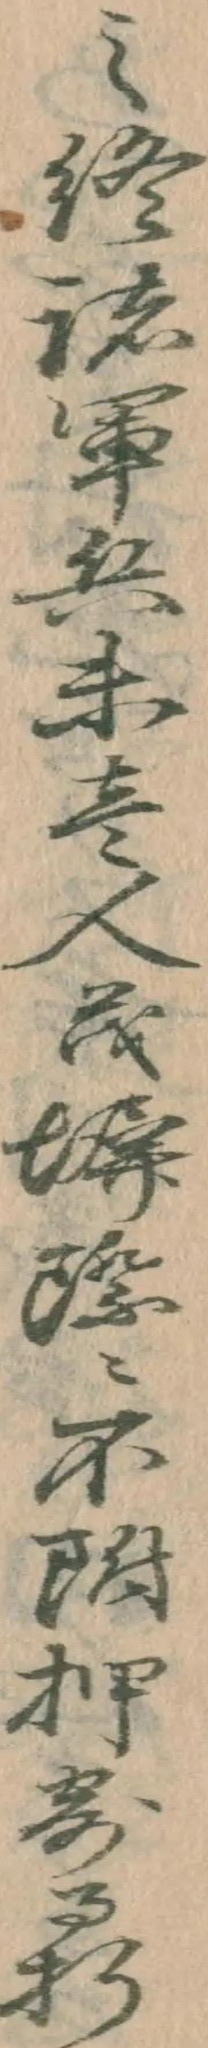之終諸軍兵未壱人茂塀際に不附押寄る折
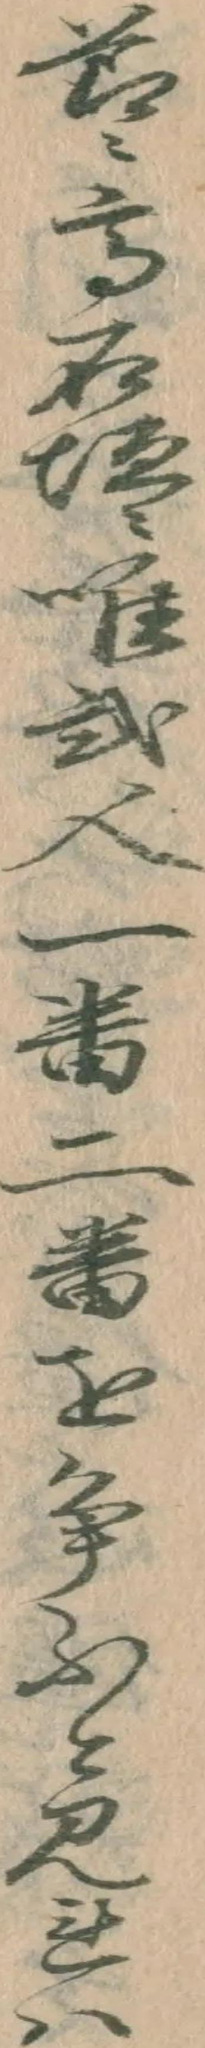節に高石垣に唯弐人一番二番を争ふと見連は
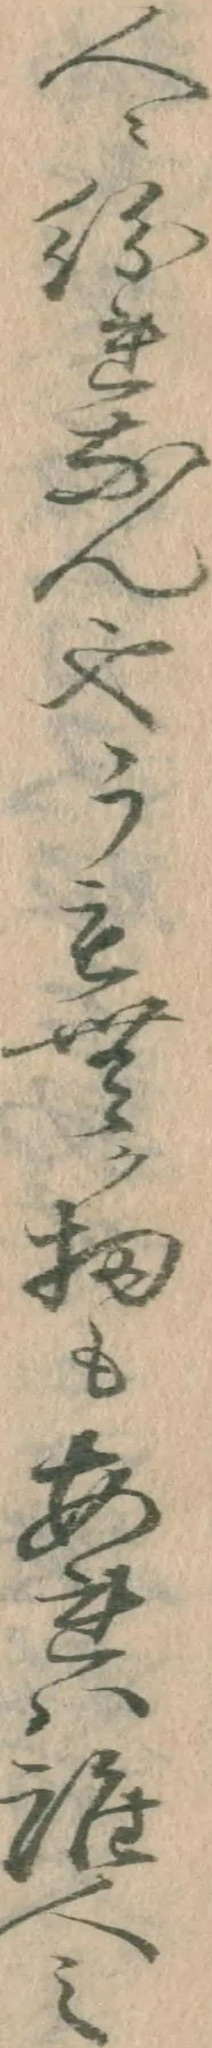人に紛連なんやうも無く扨もあ連は誰人之
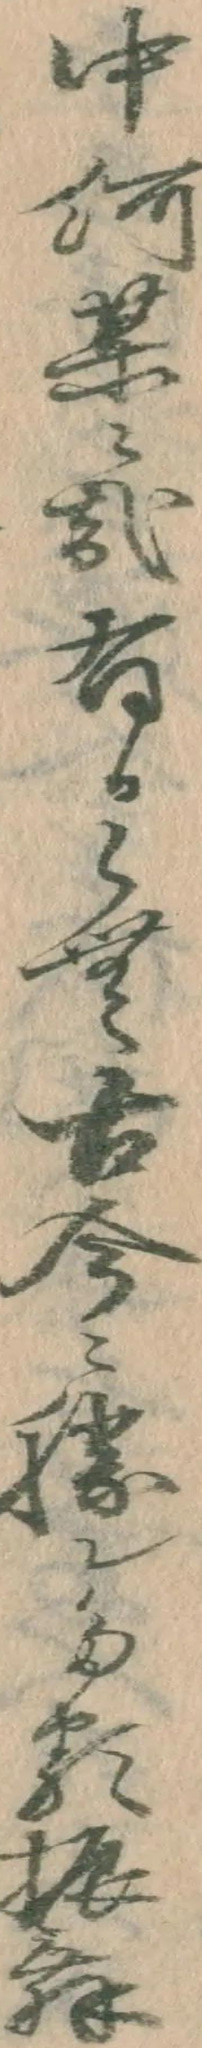中何某に哉有るか無古今に勝し多類振舞
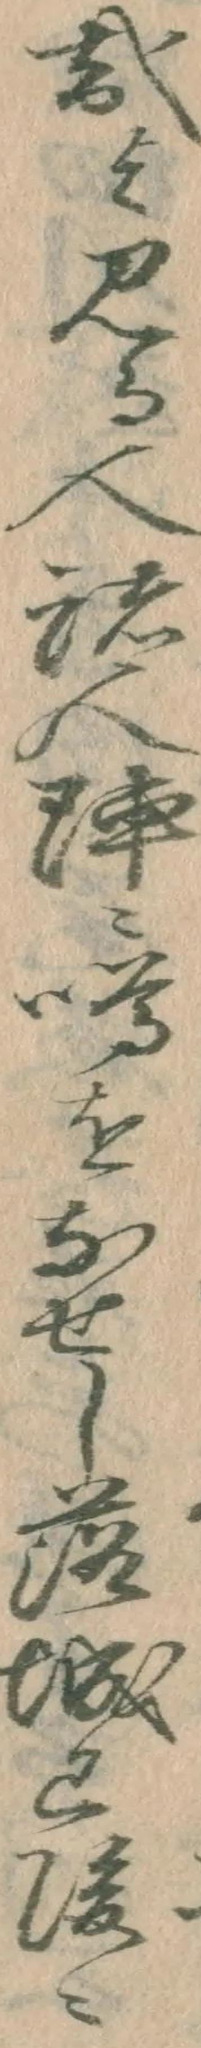哉与見る人諸人陣に噂をなせし落城己後に
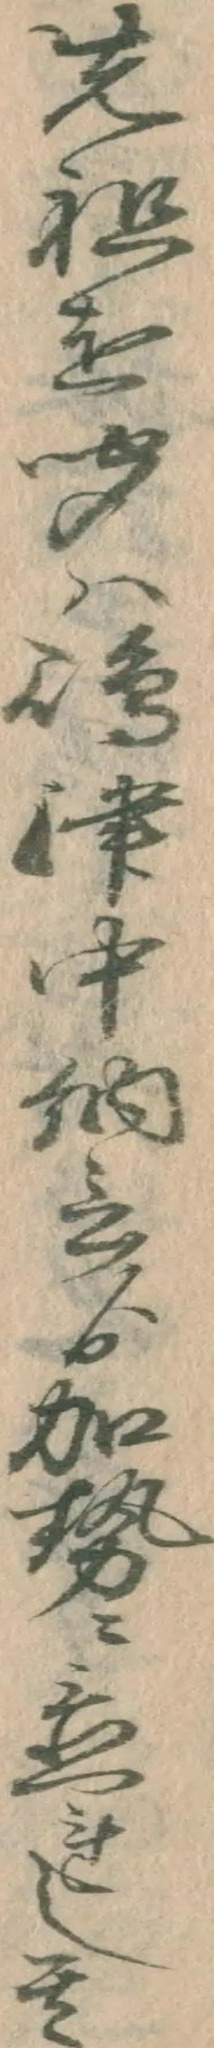先祖を聞は島津中納言ゟ加勢に置連し其
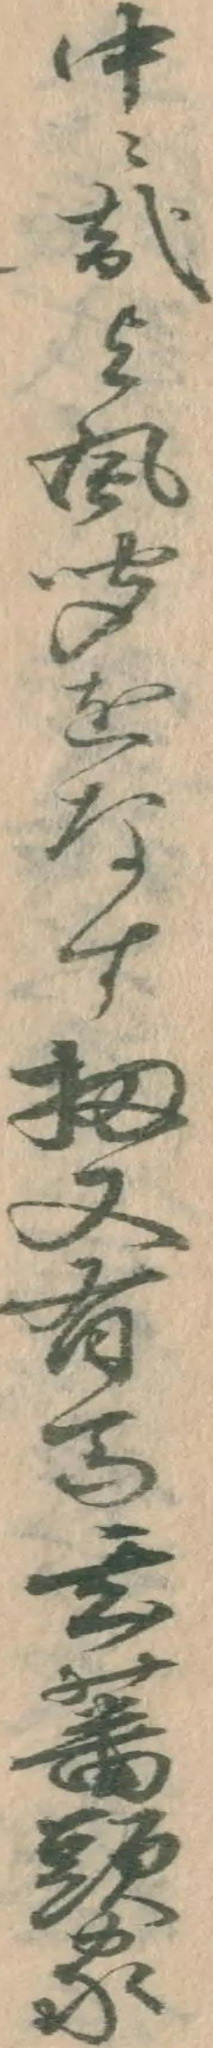中に哉与風聞をなす扨又有馬玄蕃頭家
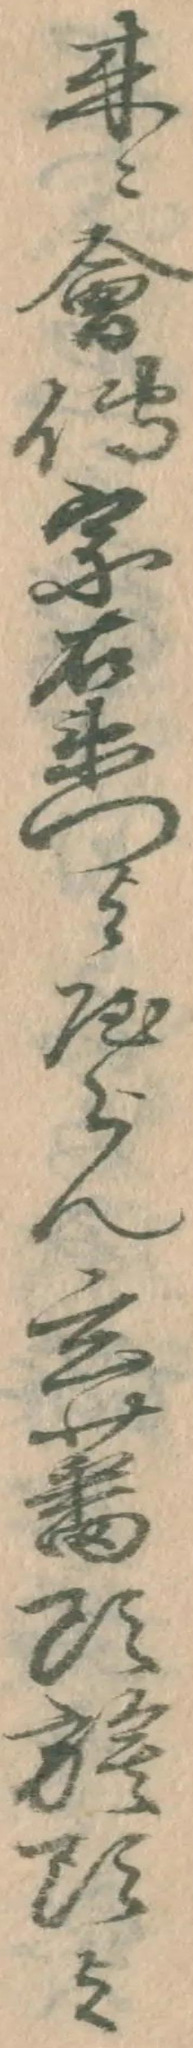来に會傳宗右衛門与屋らん玄蕃頭旗頭与

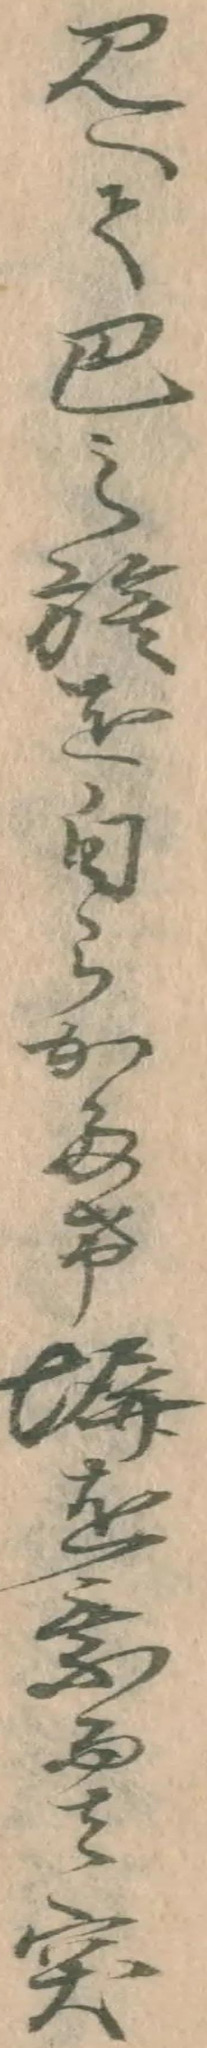見へて巴之旗をじ自らか多き希塀を乗而者突
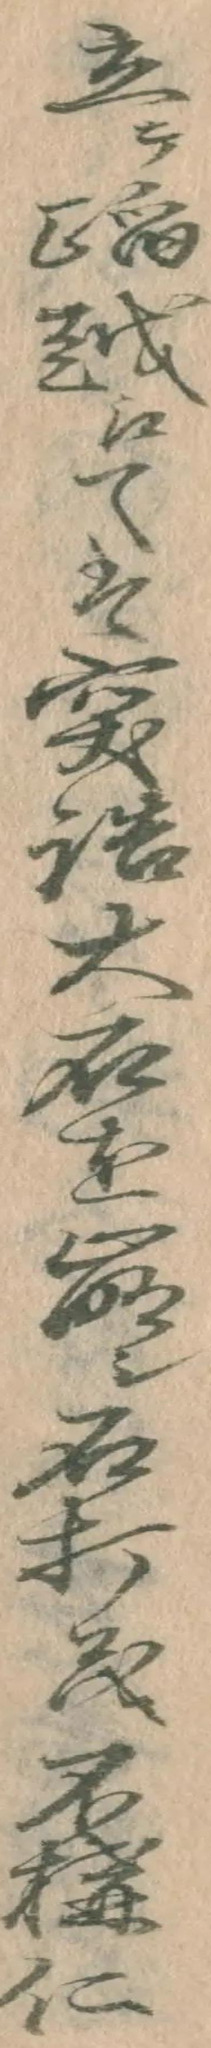立て踏越江て盤突詰大石を崩し石打茂不構仁
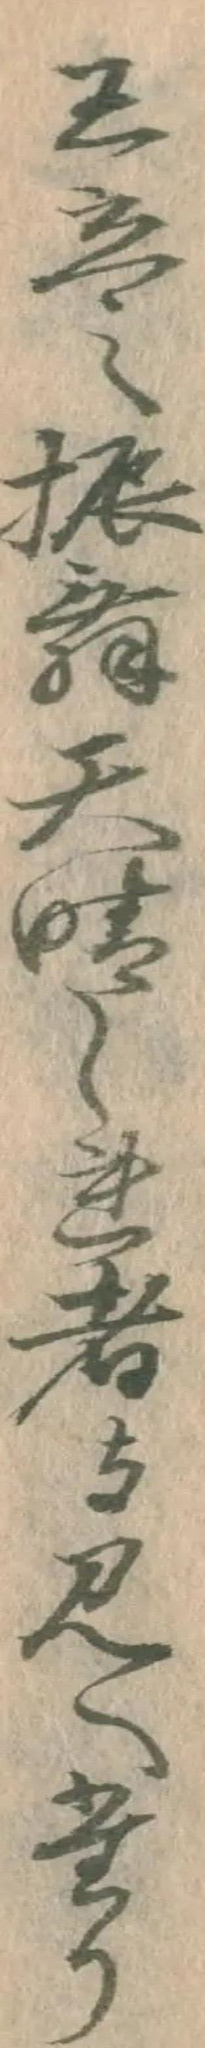王立之振舞天晴し連者与見へ堂り
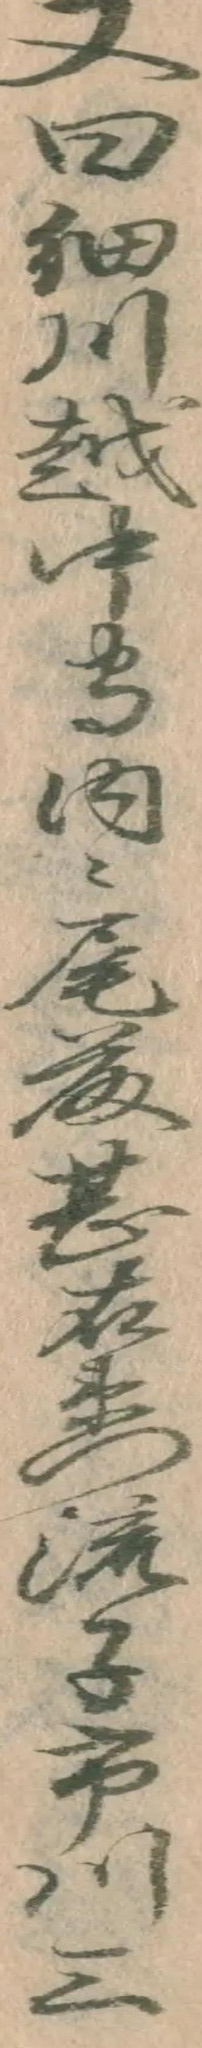又曰細川越中守内に尾藤甚右衛門流子市川三
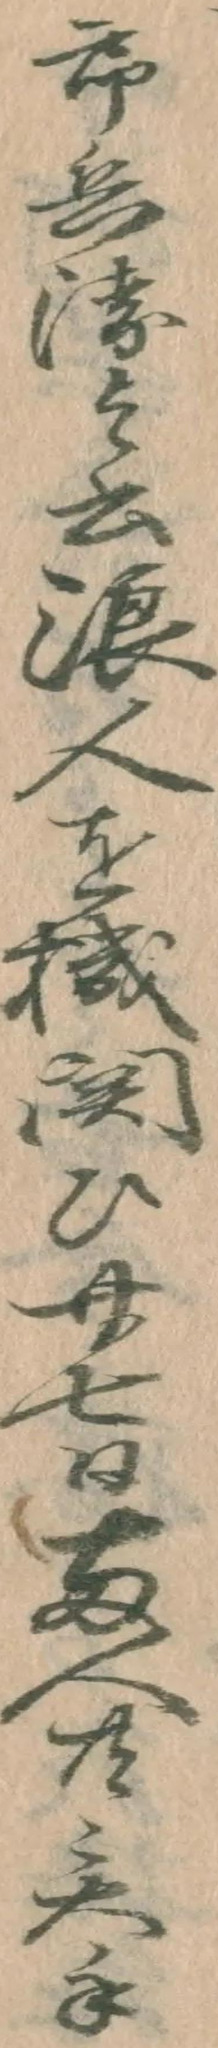郎兵衛与云浪人を機関ひ廿七日両人共に大手
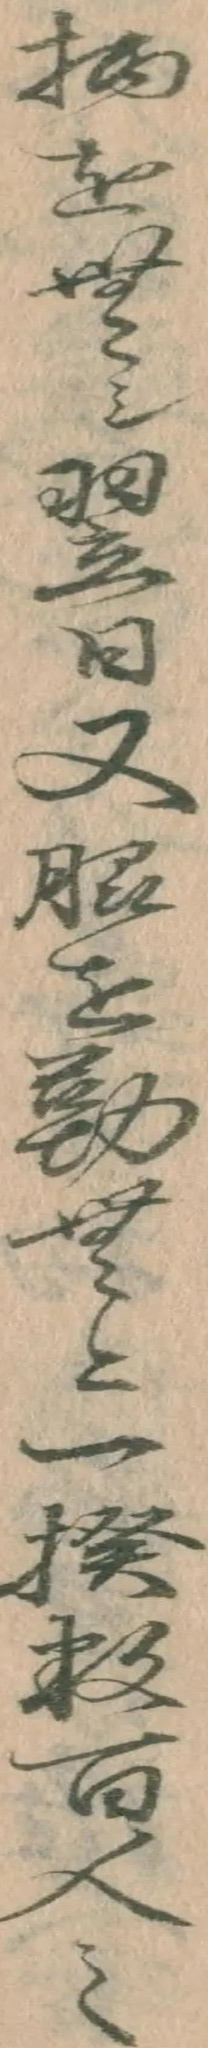柄を無し翌日又服を勤無と一揆数百人之
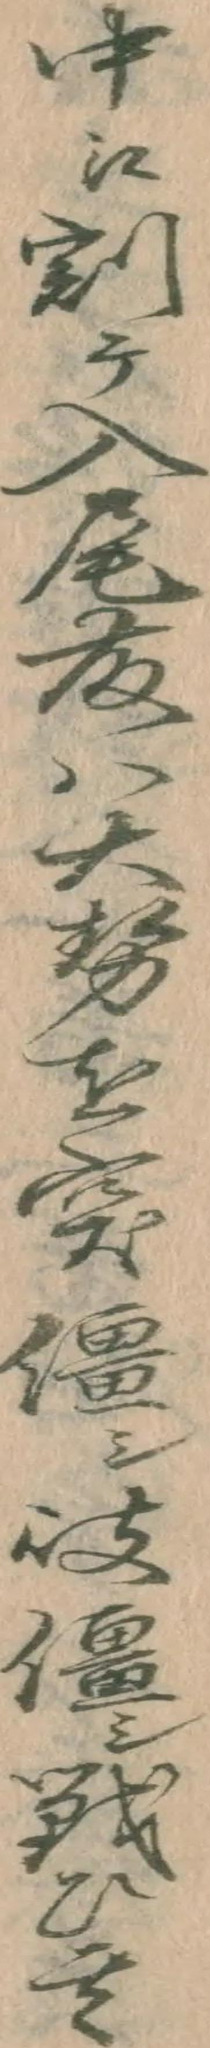中江割て入尾藤は大勢を突僵し彼僵し戦ひ其
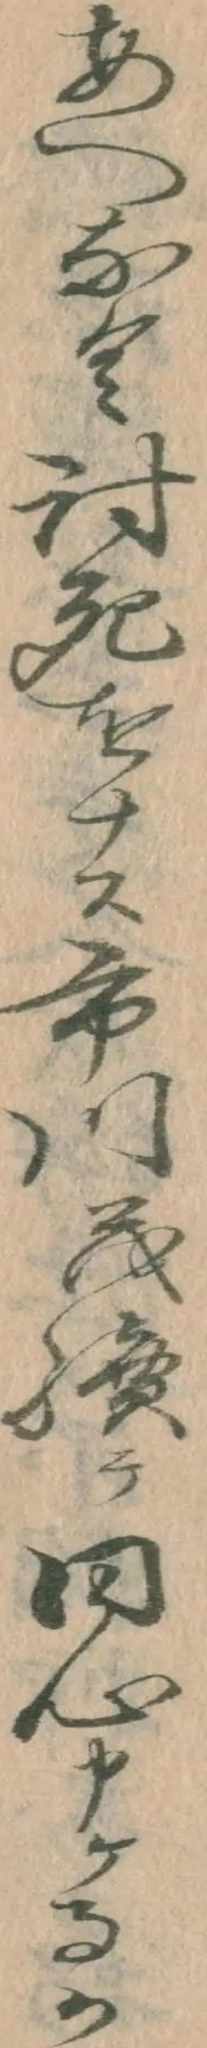あへな具討死をなす市川茂続て同心申けるか
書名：切支丹御退治記 49巻. [8]
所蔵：国立国会図書館 National Diet Library, JAPAN
